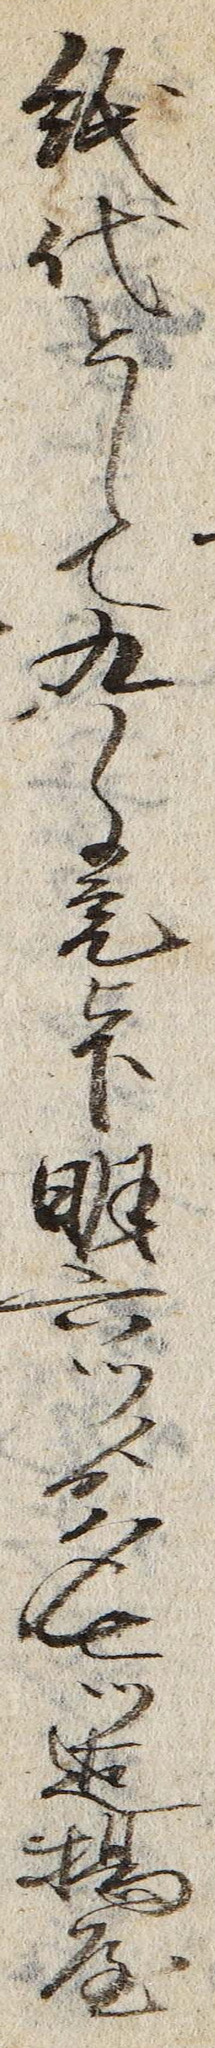紙代として九文宛被下明六つより夕七つ迄揚屋
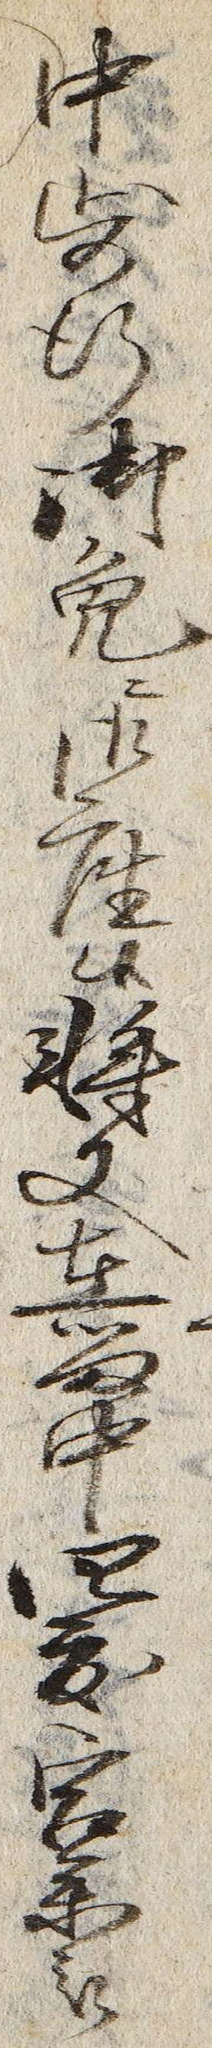中歩行御免に御座候将又在留中四度宮参被
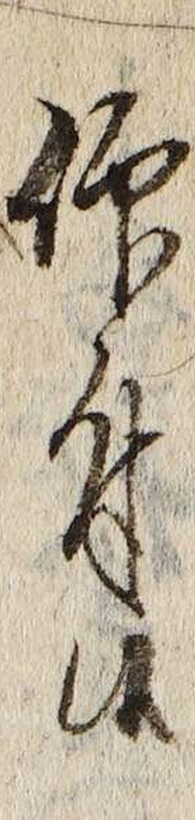仰付候
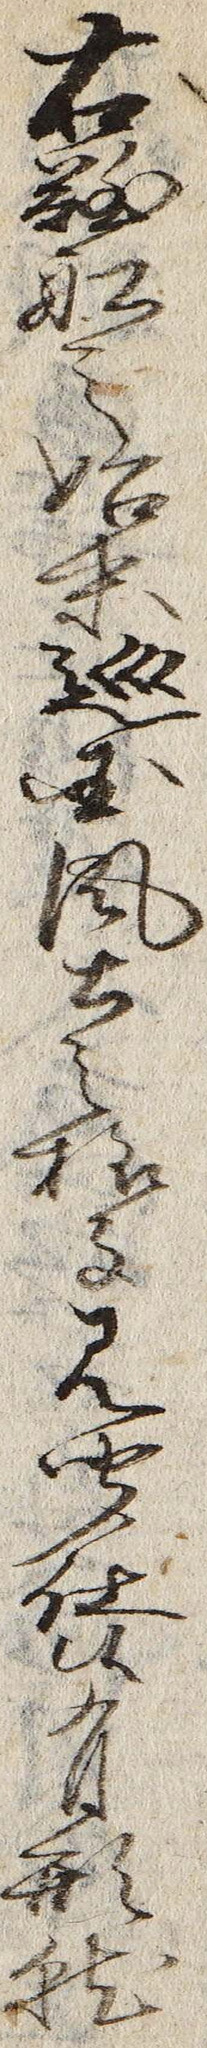右難船の始末巡国風土の様子見聞仕候有形就
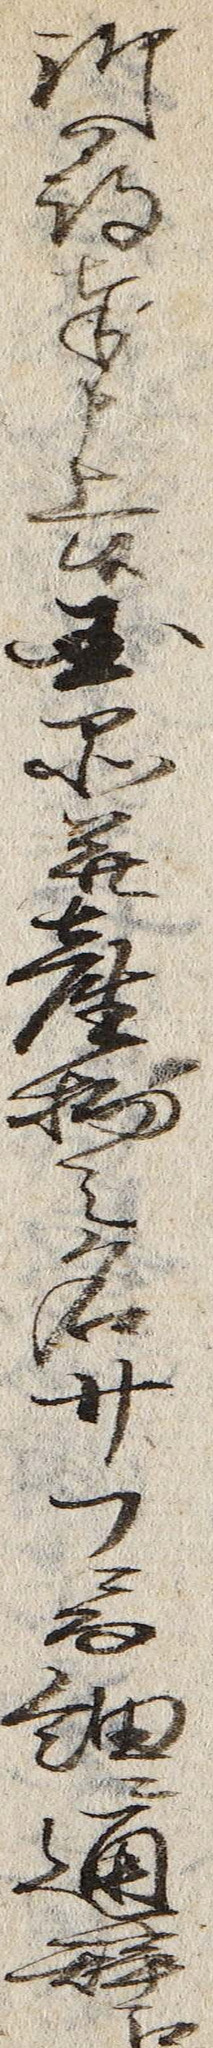御尋奉申上候国品幷産物の名サフにて細に通辞へ
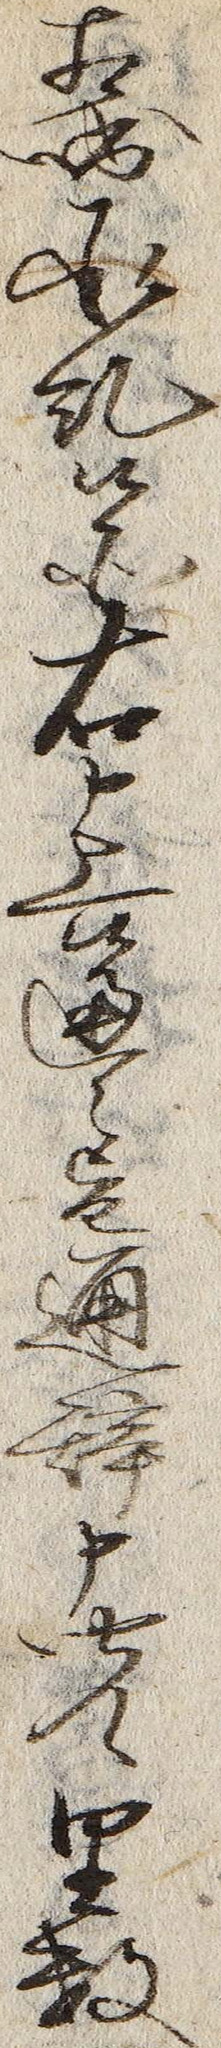相話承糺候所右申上候通の旨通辞申聞候里数
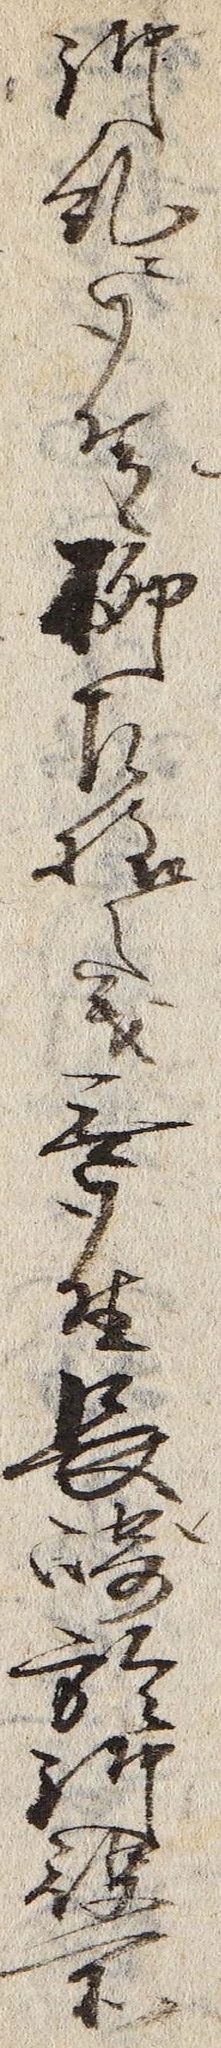御糺に御座候聊左様の義無御座長崎於御役所
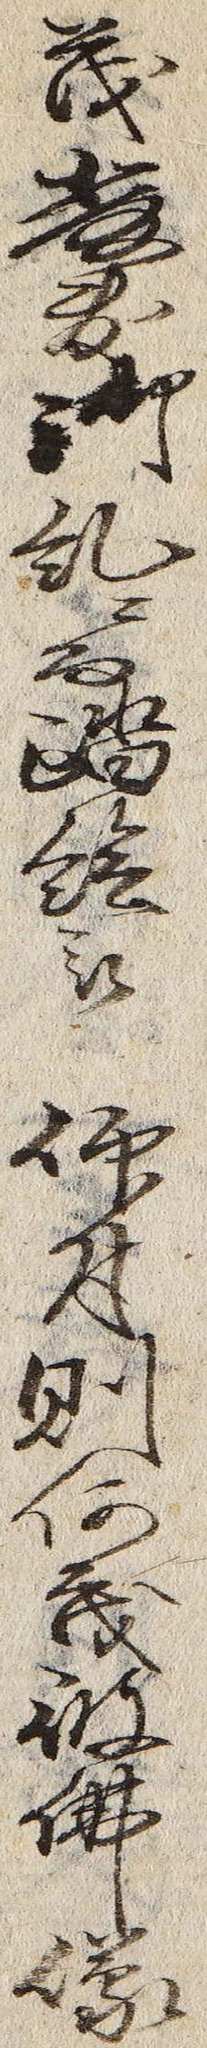も厳しく御糺にて踏絵被仰付則何も仏像
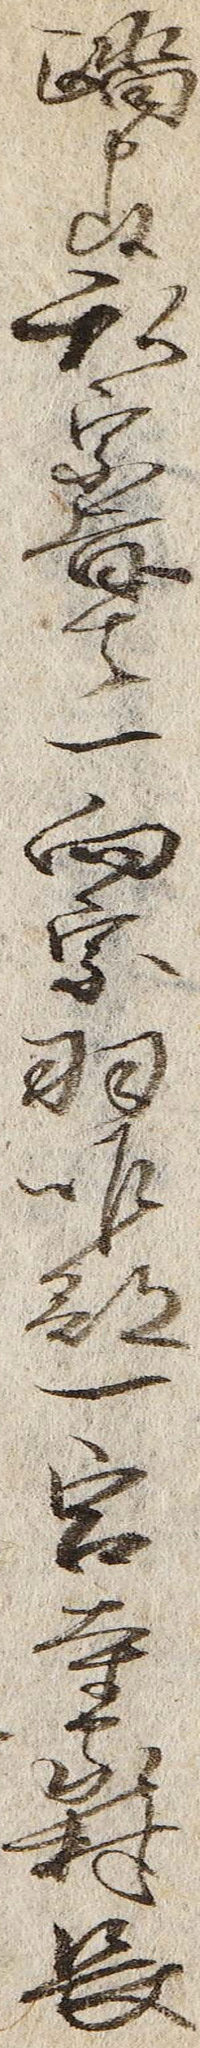踏申候私宗旨は一向宗羽咋郡一宮寺家村長
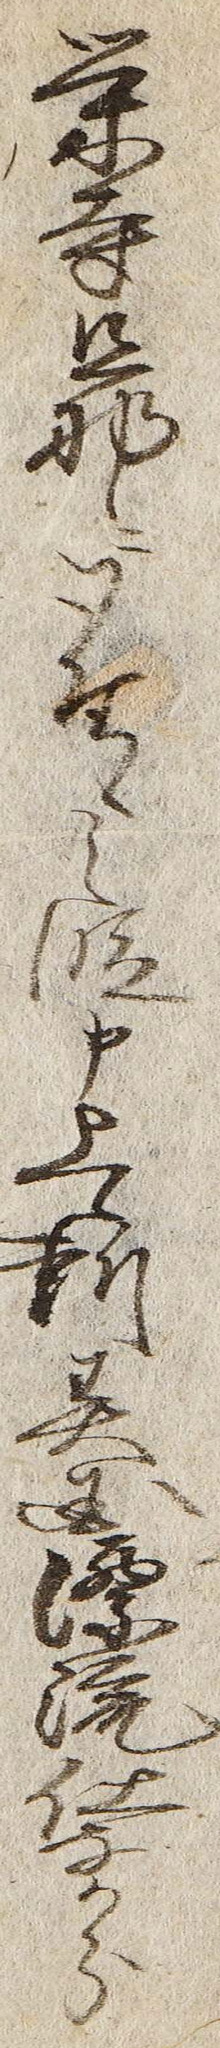栄寺旦那に御座候の段申上候所異国漂流仕なから
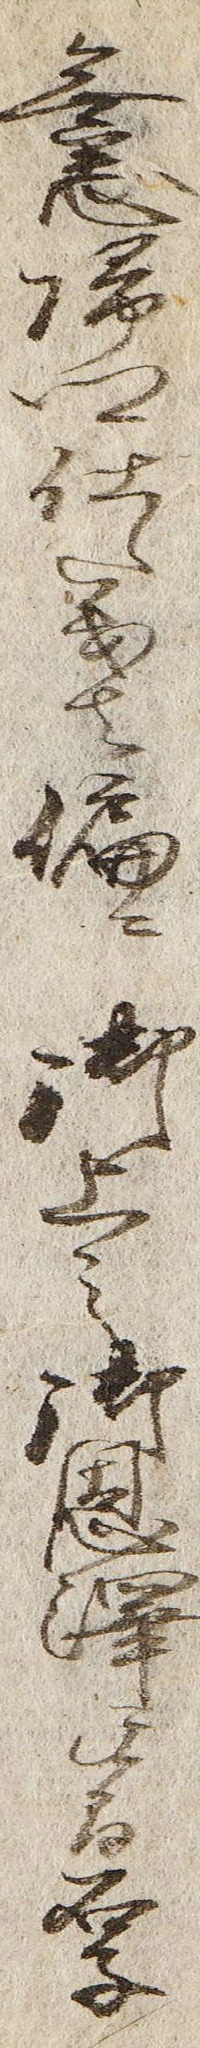無恙帰国仕候義は偏に御上の御恩沢に候間厚
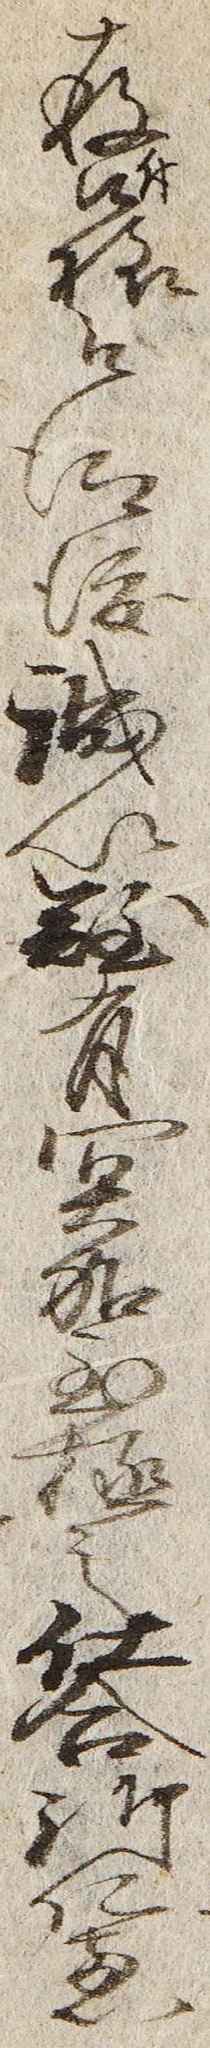存付候様被仰渡誠もって難有冥加至極の仕合御仁恵
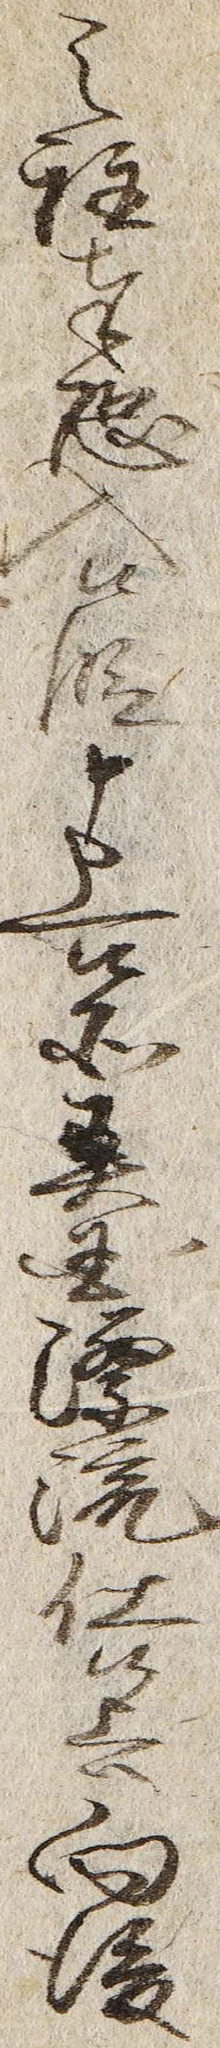の程奉恐入候段申上候所異国漂流仕候上は向後
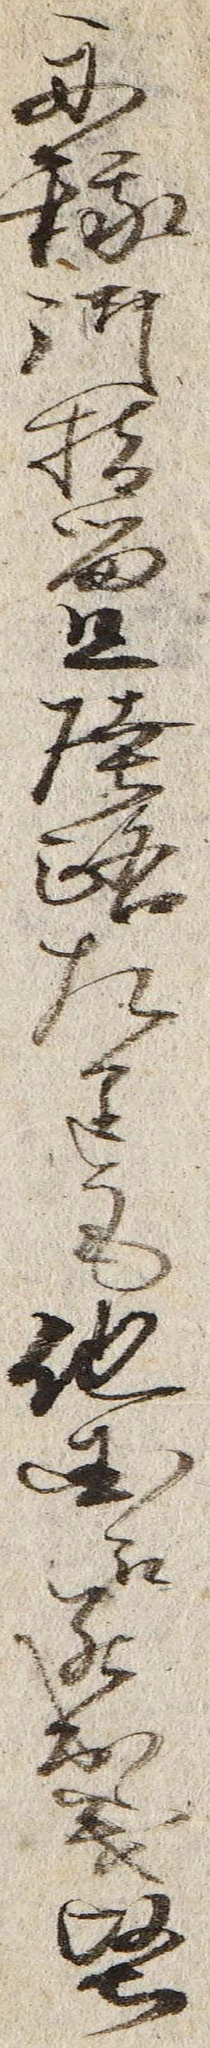舟稼御指留且陸路たりとも他国へ罷出候義皆
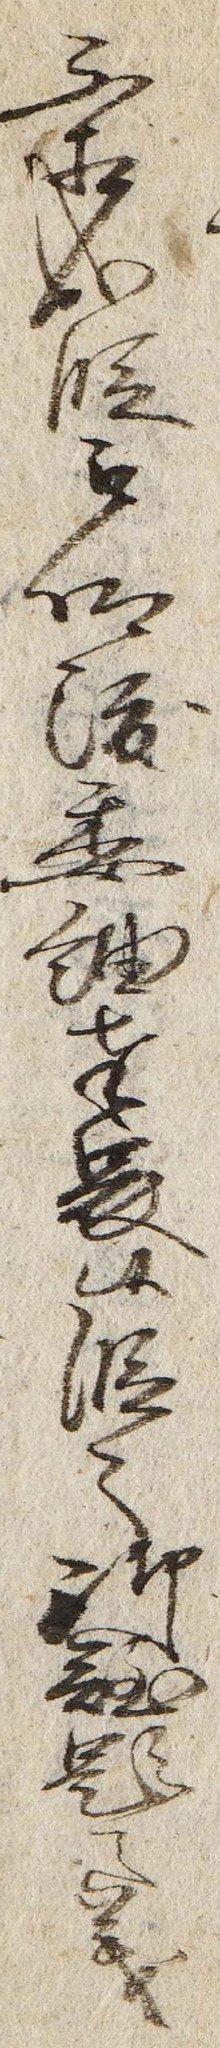不相成段被仰渡委細奉畏候段々御難題の義
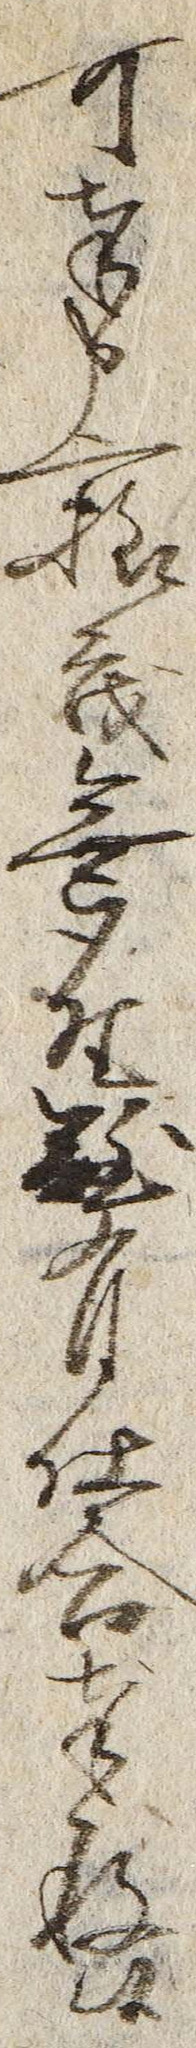可奉申上様も無御座難有仕合奉存候
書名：能登国清兵衛異国江漂流之始末
